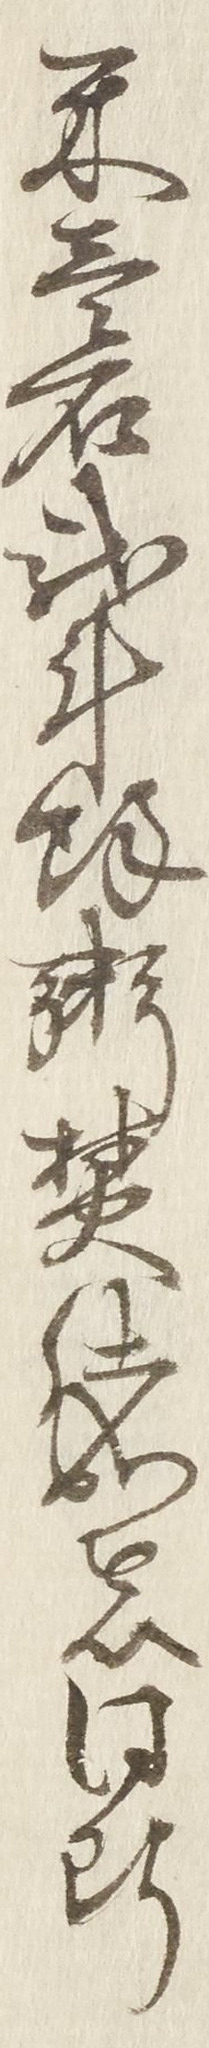米壱石弐斗餘粥焚仕成を以同断
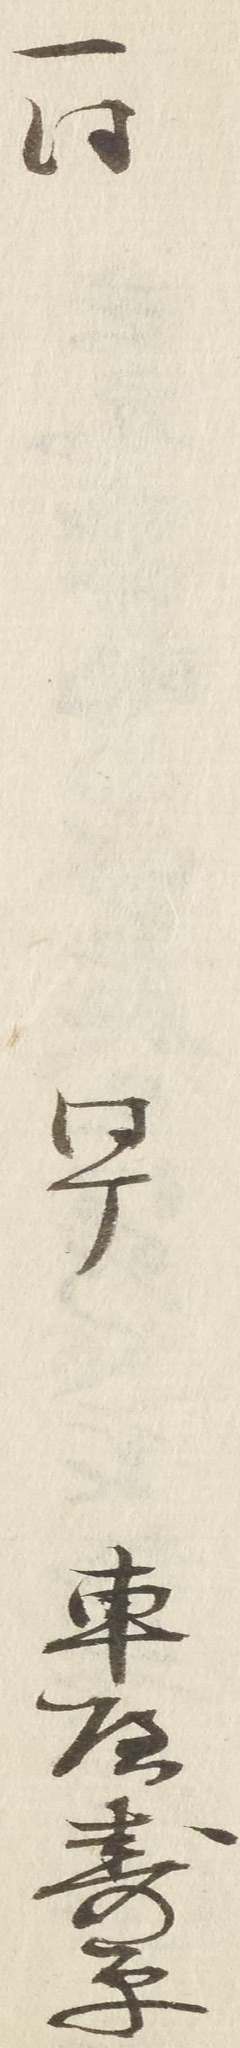一同同丁車屋寿平
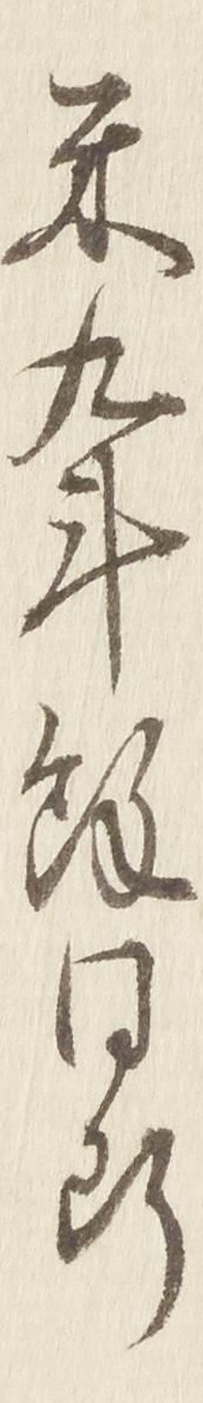米九斗餘同断
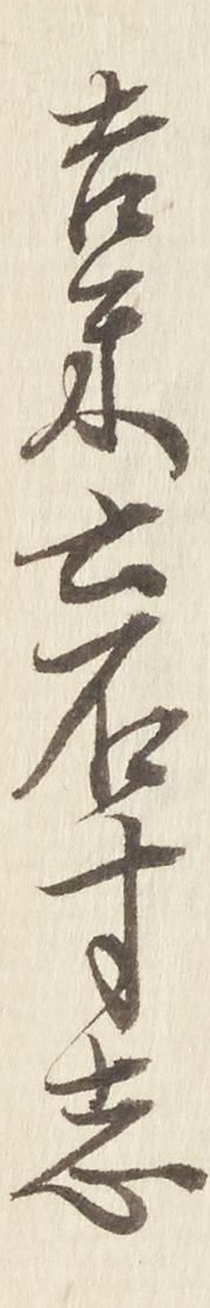吉米六石寸志
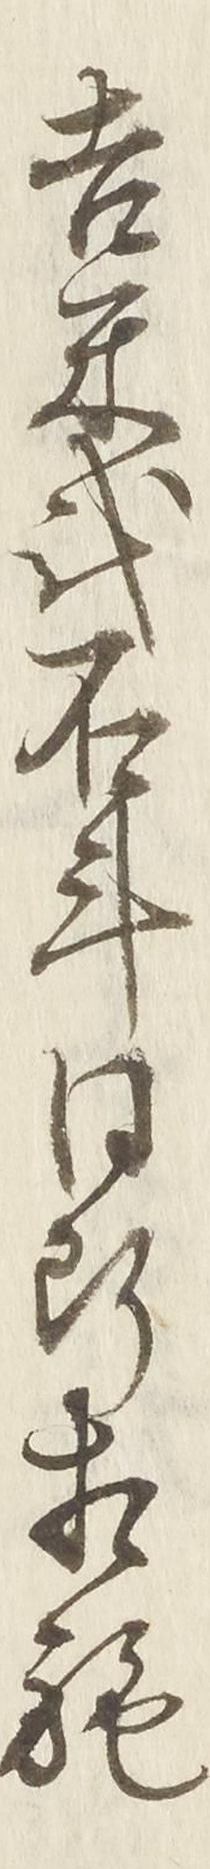吉米弐石斗同断相施
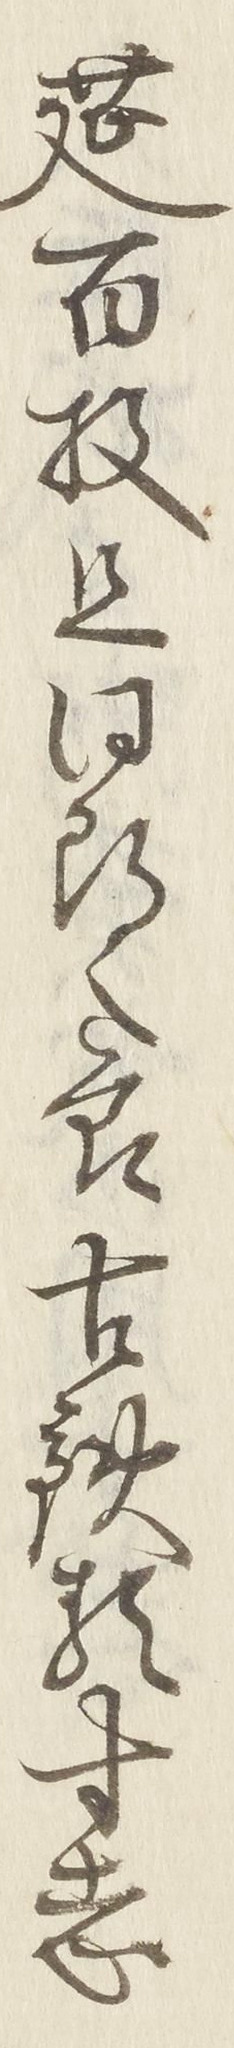莚百枚且同断之節古鉄類寸志
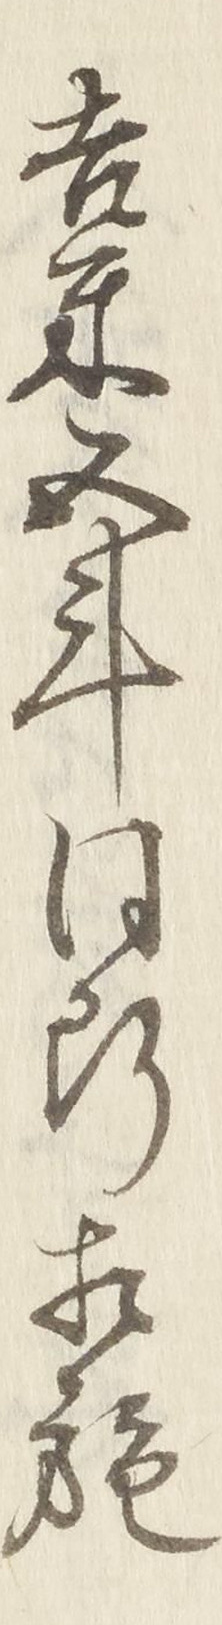吉米五斗同断相施
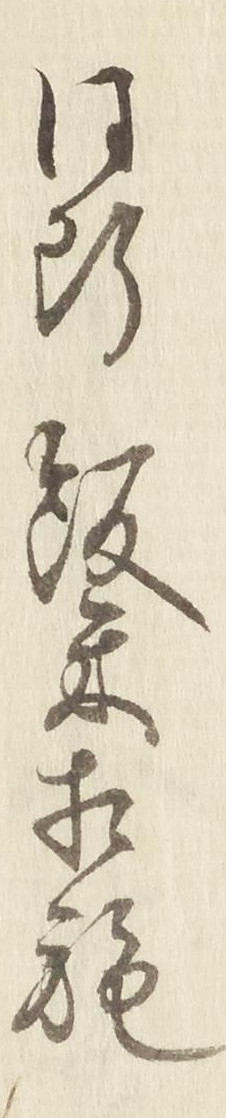同断飯米相施

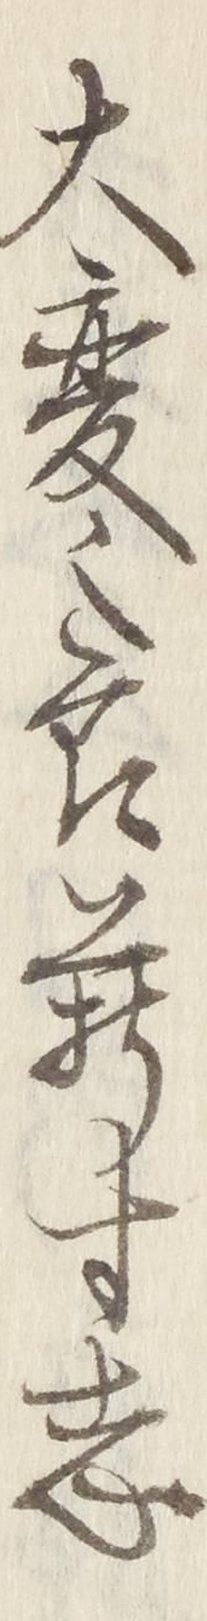大変之節薪寸志
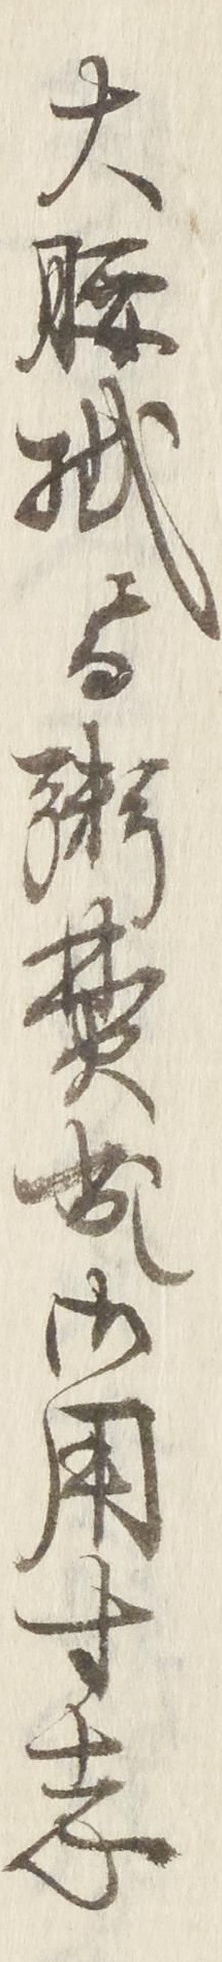大腰掛二而粥焚出し御用寸志
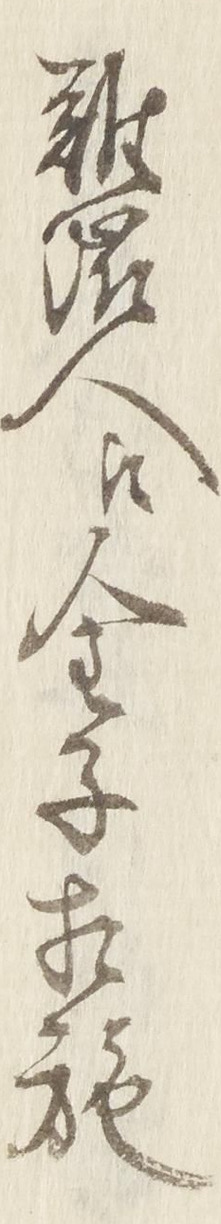難渋人江金子相施
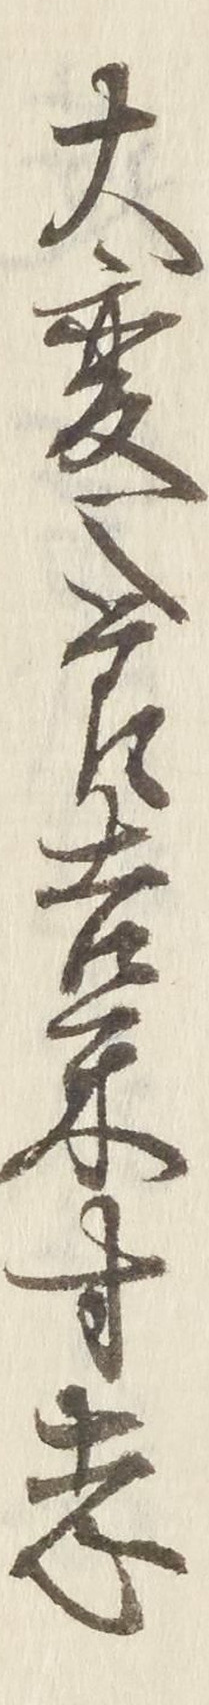大変之節吉米寸志
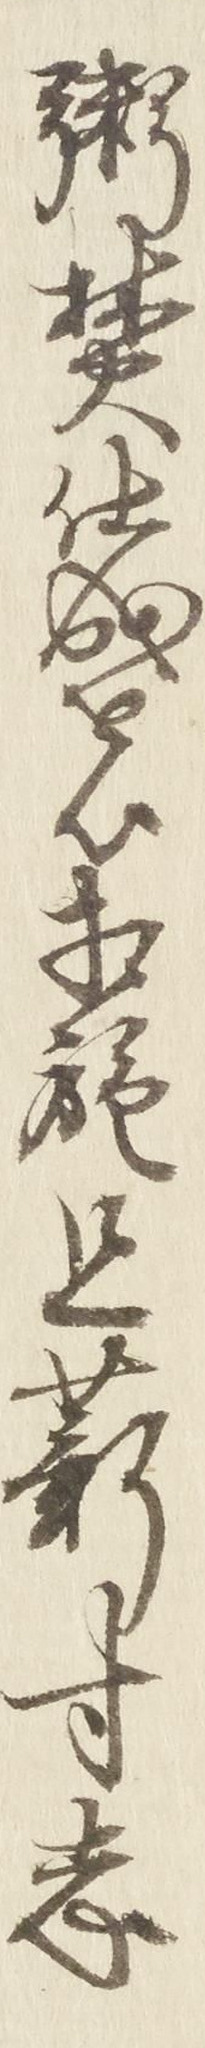粥焚仕成を以相施且薪寸志
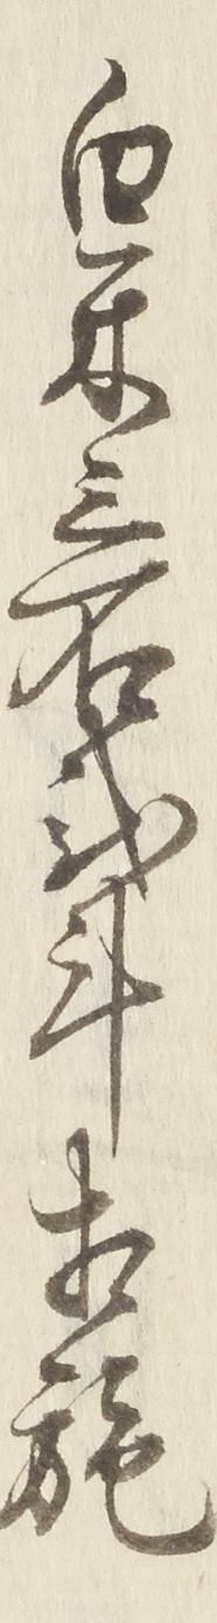白米三石弐斗相施
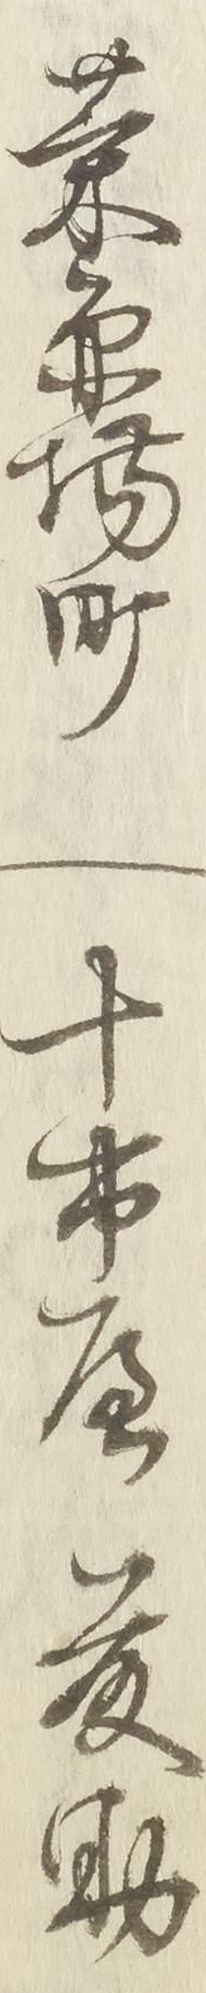菜円場町十市屋藤助
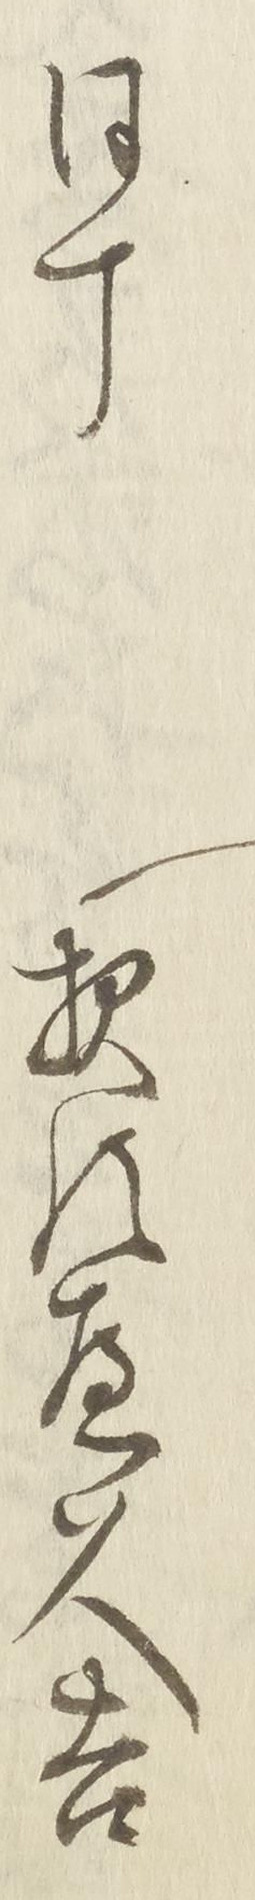同丁夜須屋久吉
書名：地震記　下
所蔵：東京大学地震研究所図書室 Earthquake Research Institute Library, The University of Tokyo, JAPAN
